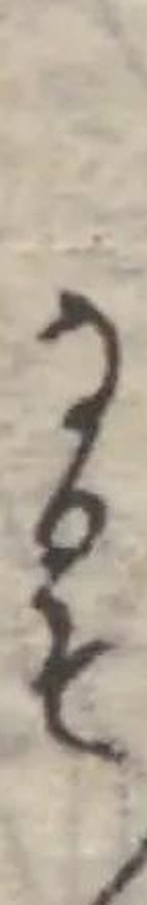なるそ
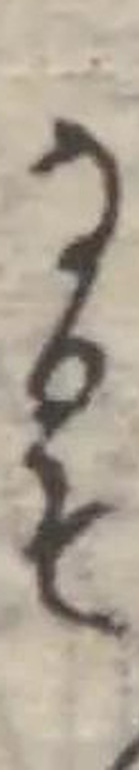なるそ
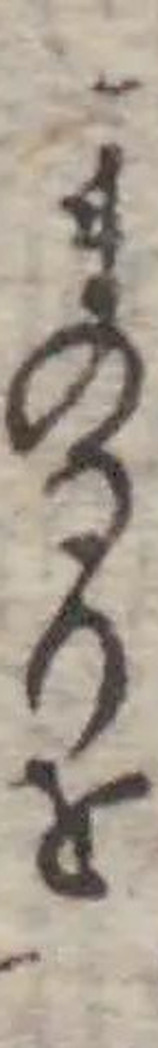まのなりを
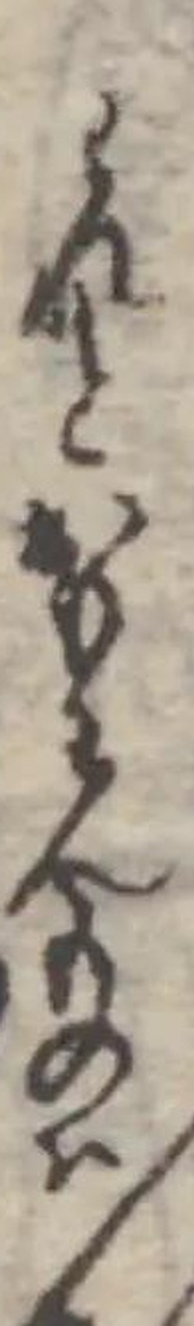われとおもわんものは
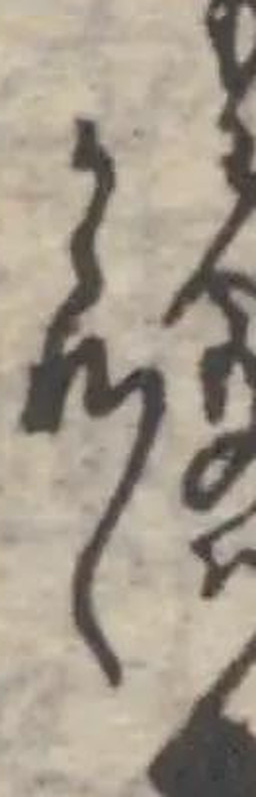かゝれ〳〵
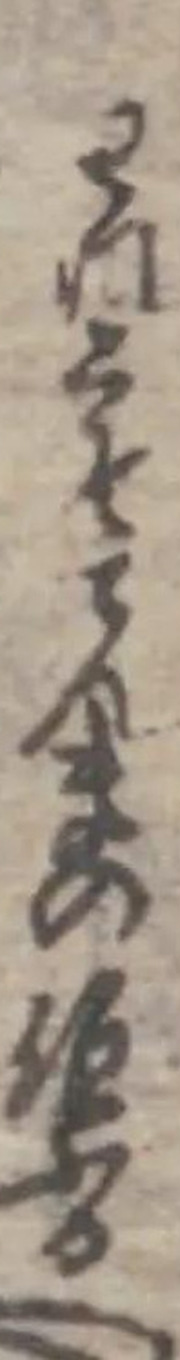われこそてんまのふる
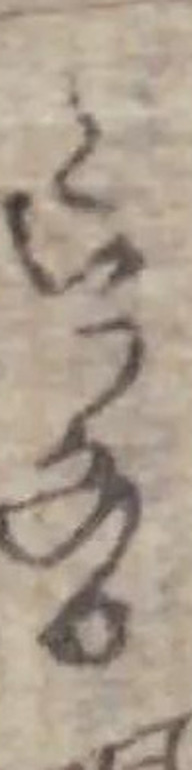こいつかいる
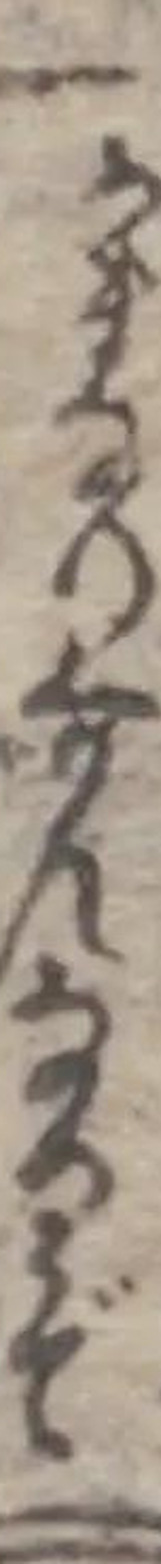かまなりへもんなるぞ
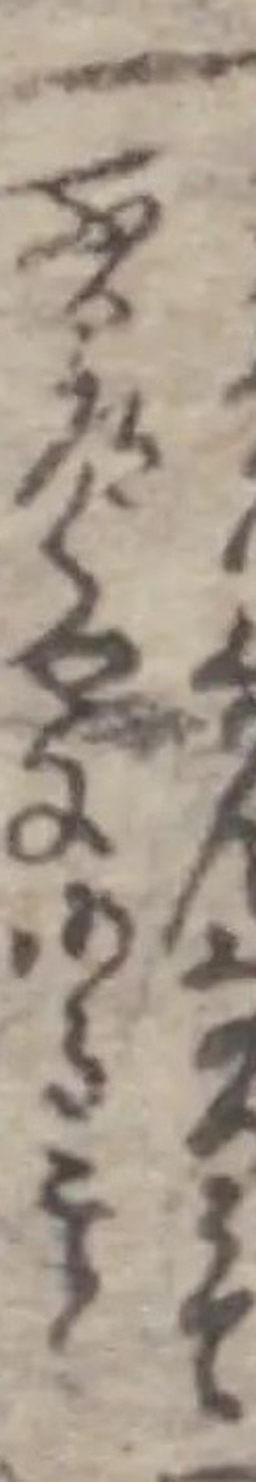ふる道ぐやにあること
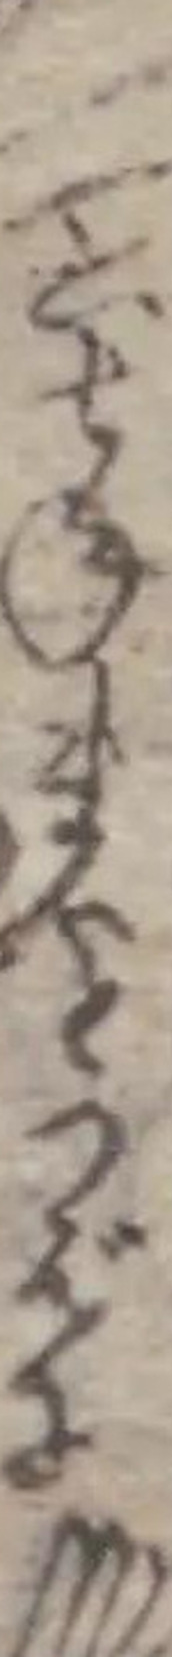六十年まへとつばに
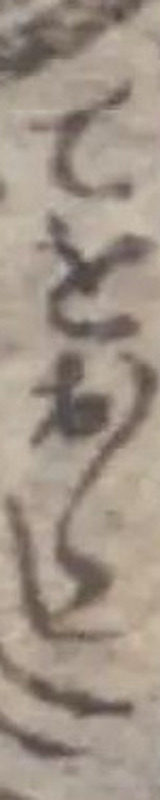てをおゝし
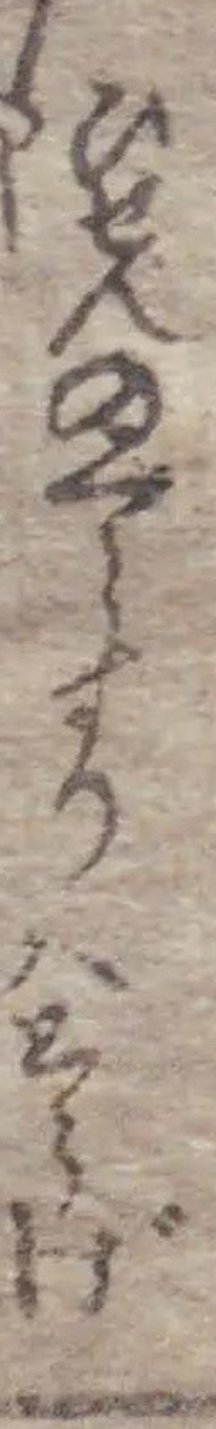ひせんのくらすり八とうげ
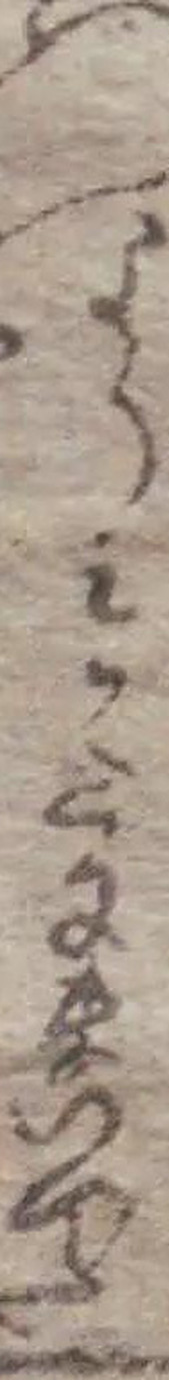よりみかたにまいつた
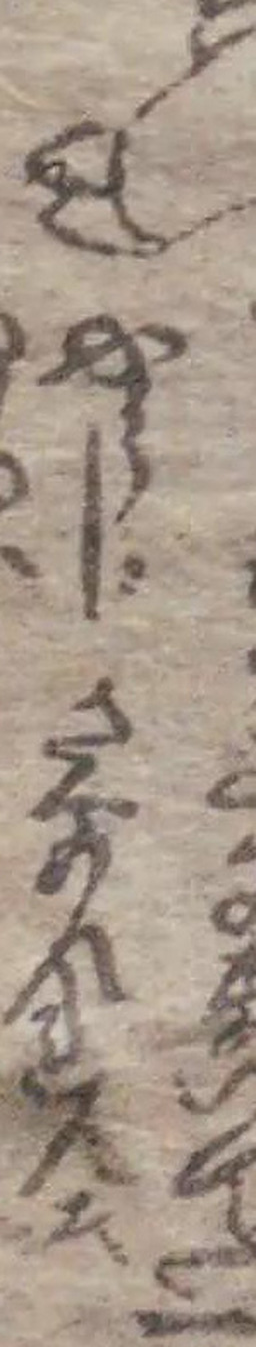やうじさへもんれん

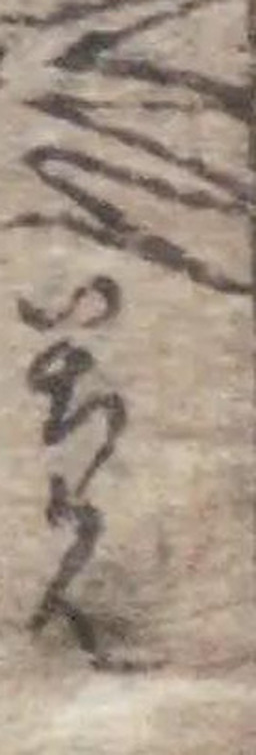いちかん
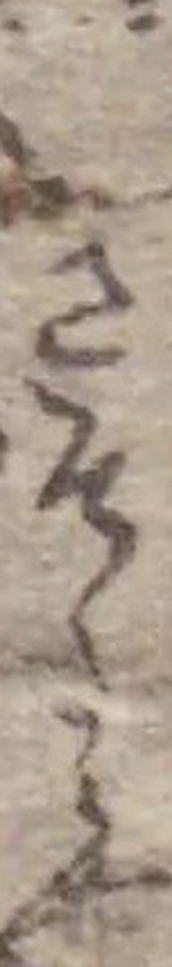さそくの介
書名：化物三ツ目大ほうい 2巻
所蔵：国立国会図書館 National Diet Library, JAPAN
